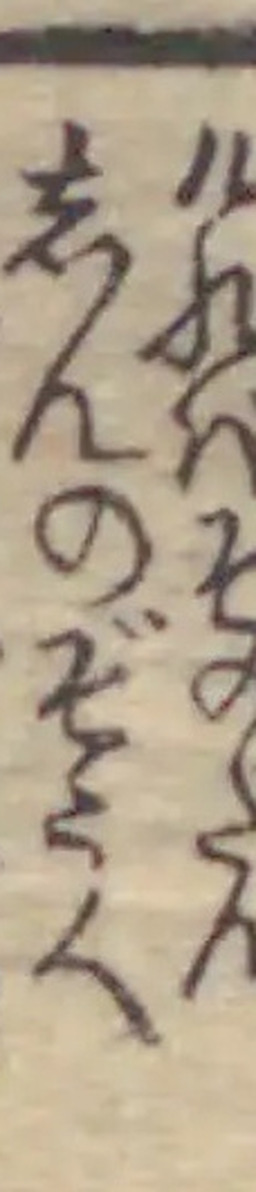しんのぞうへ
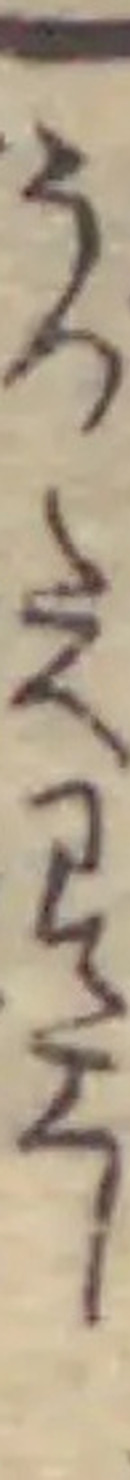うつたへわたくし
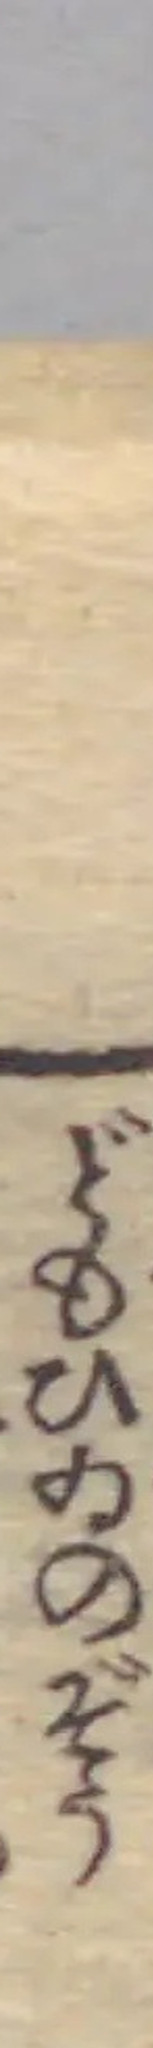どもひゐのぞう
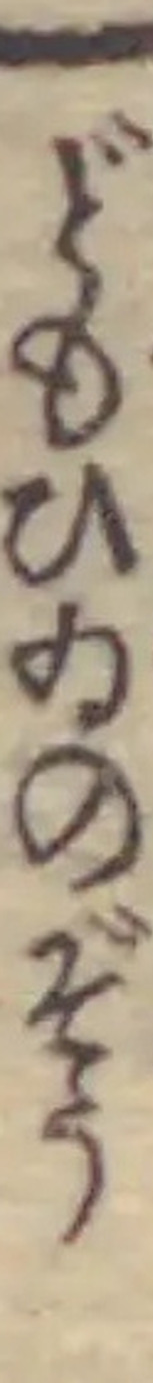どもひゐのぞう
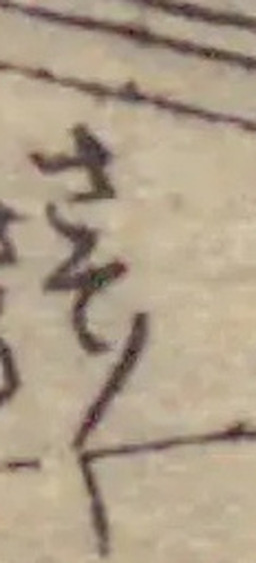さそ〳〵
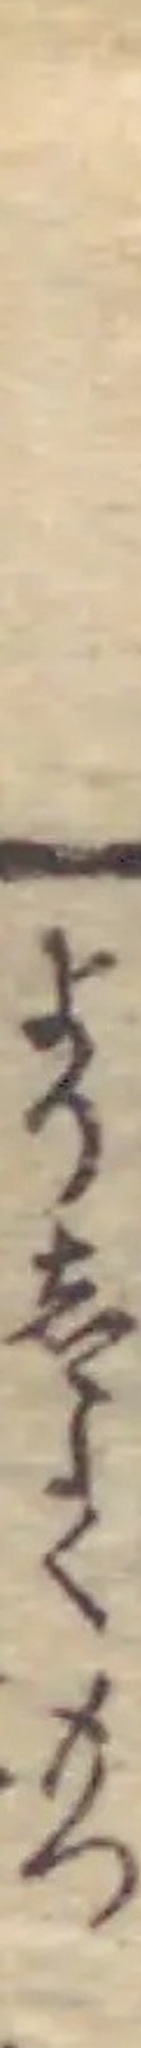よりしよくもつ
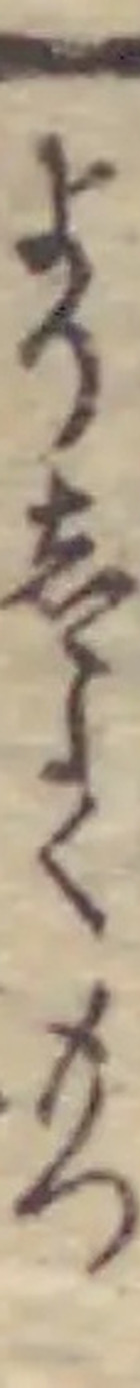よりしよくもつ
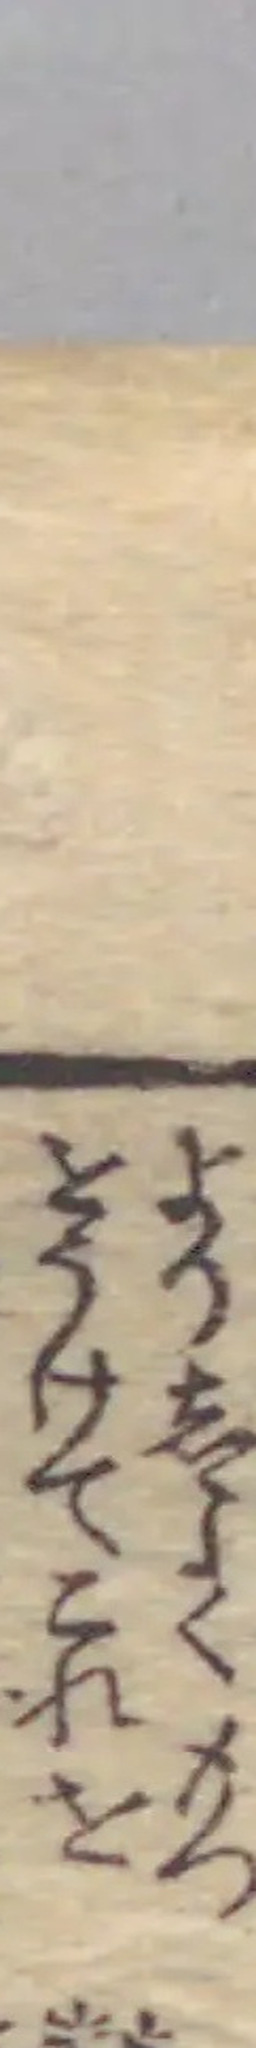をうけてこれを
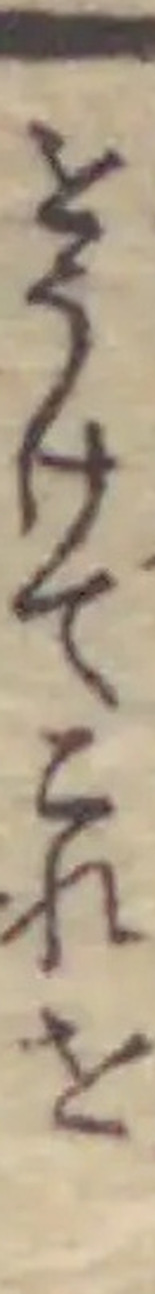をうけてこれを
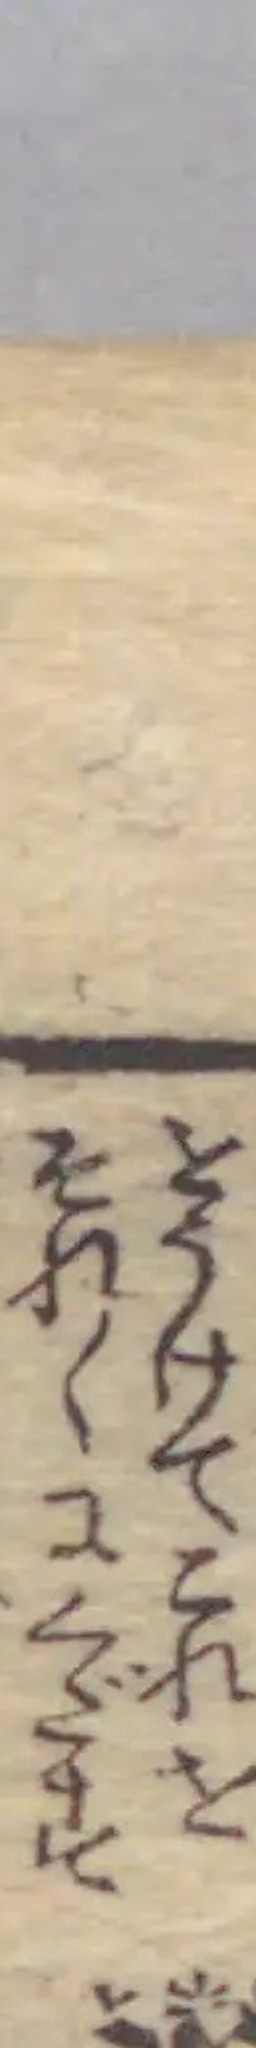それ〳〵にくだす
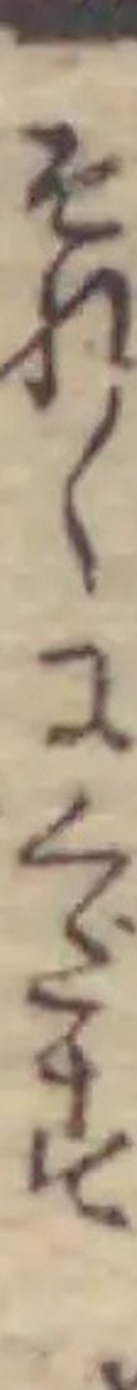それ〳〵にくだす
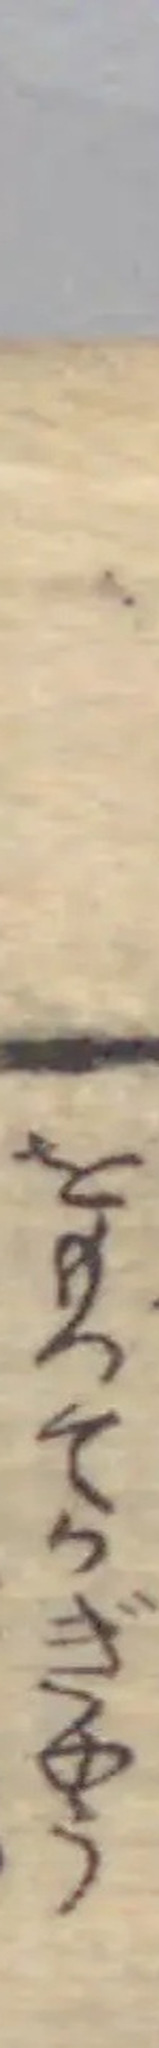をもつてかぎゆう
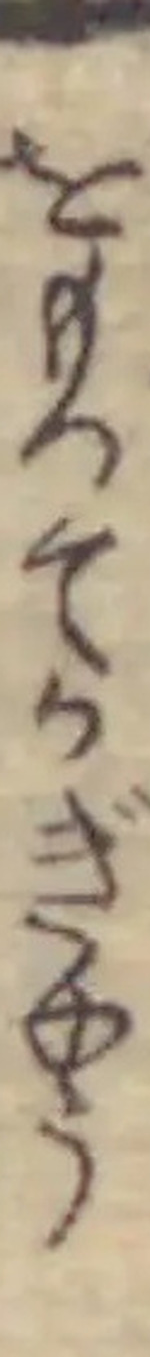をもつてかぎゆう
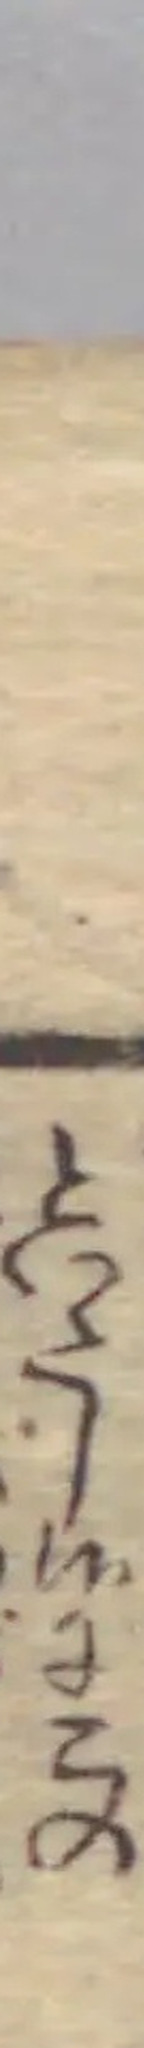といたし候にこの
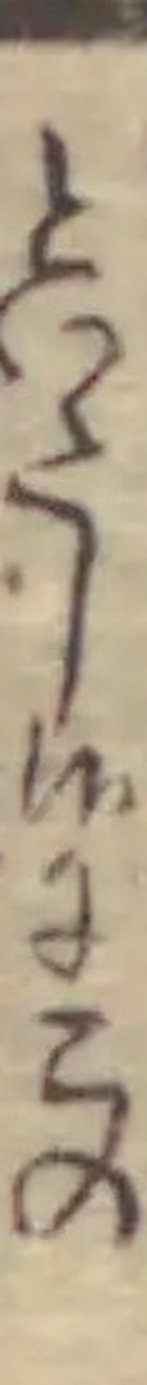といたし候にこの
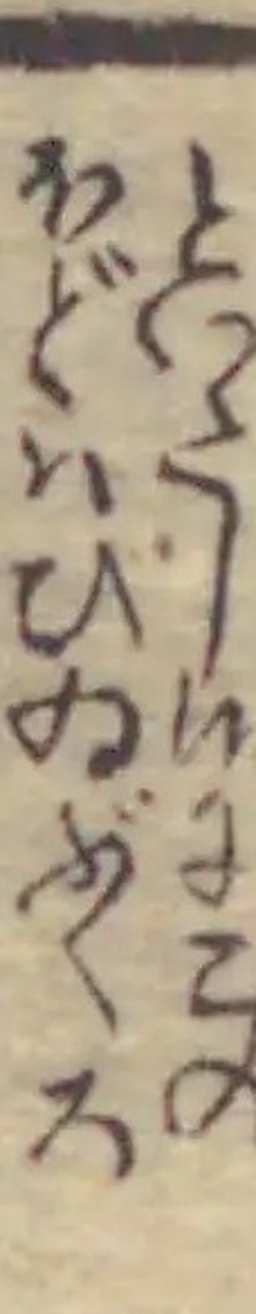ほどはひゐぶくろ
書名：腹内養生主論 3巻
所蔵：国立国会図書館 National Diet Library, JAPAN
